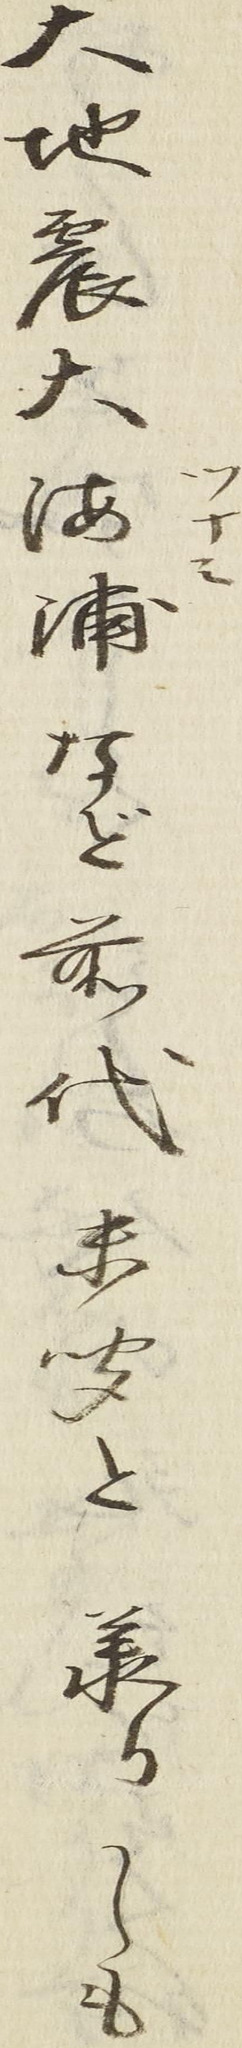大地震大海浦など前代未聞と承りしも
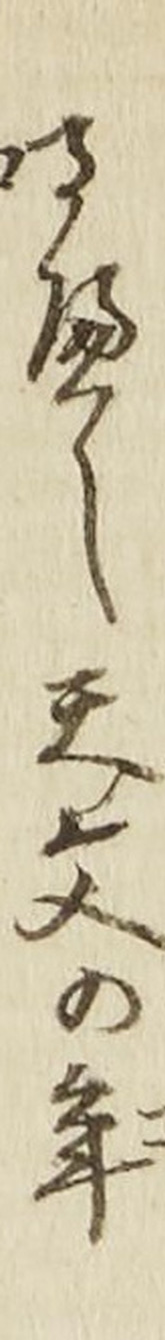るへし天文の年
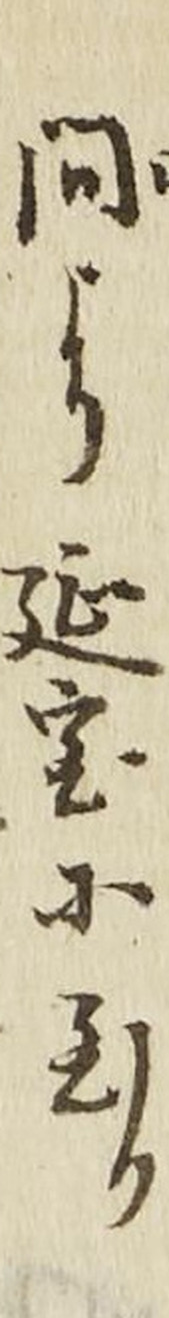間より延宝に至り
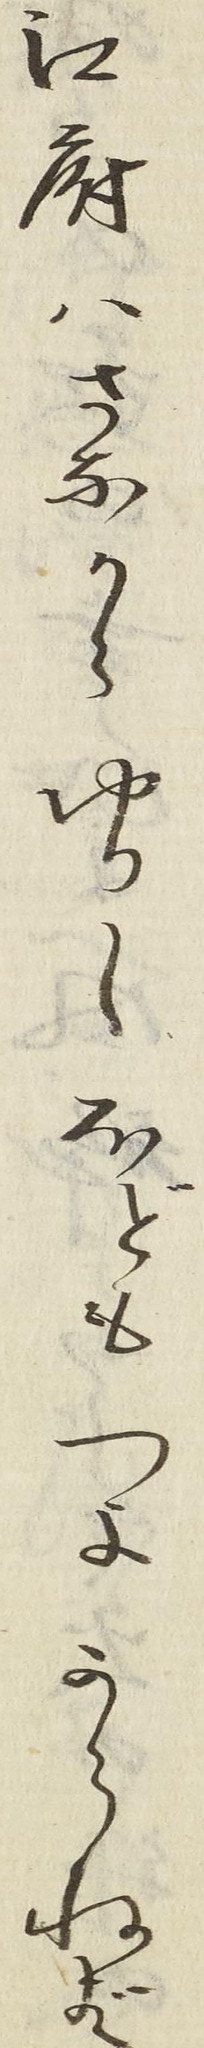江府はさなからゆりしほどもつよからねば
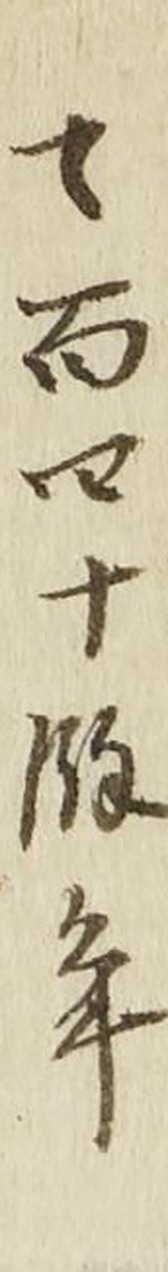て百四十余年
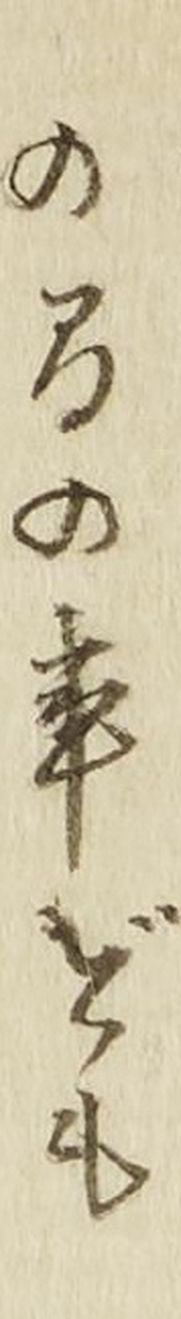の間の事ども
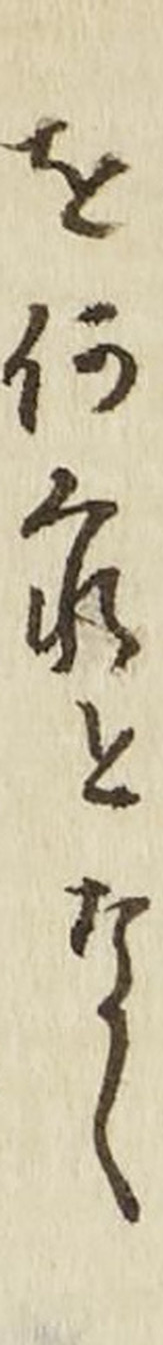を何くれとなく
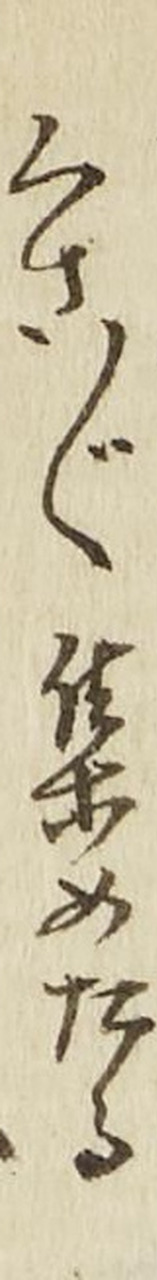くさ〴〵集めたる
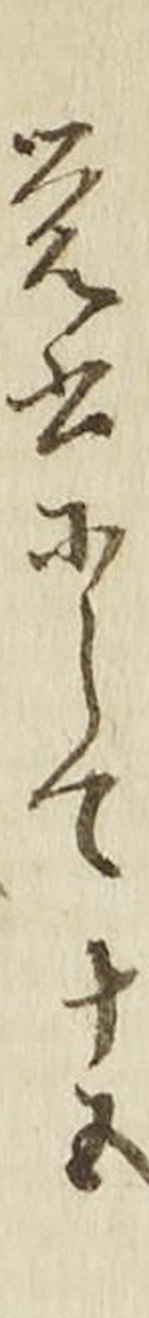覚書にして十五
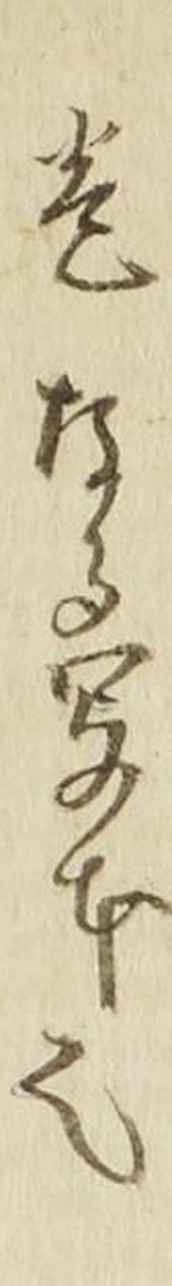巻なる写本也
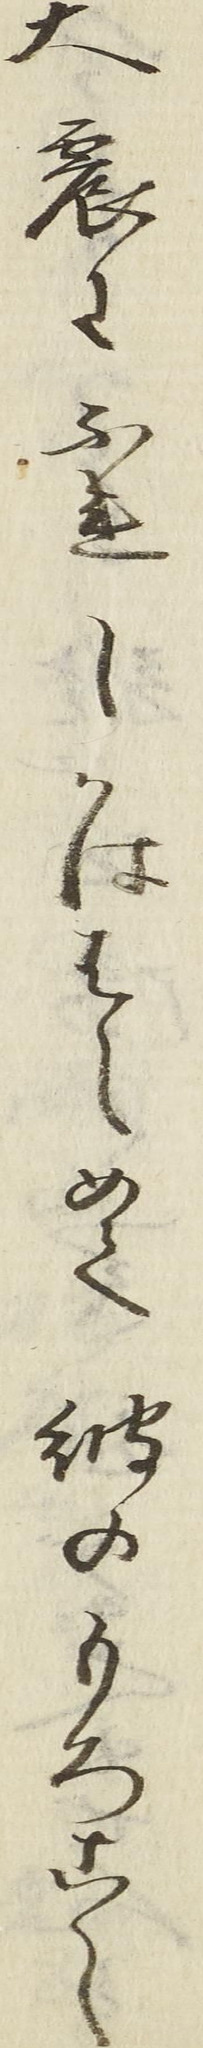大震にふれしかははしめて彼のもろこし
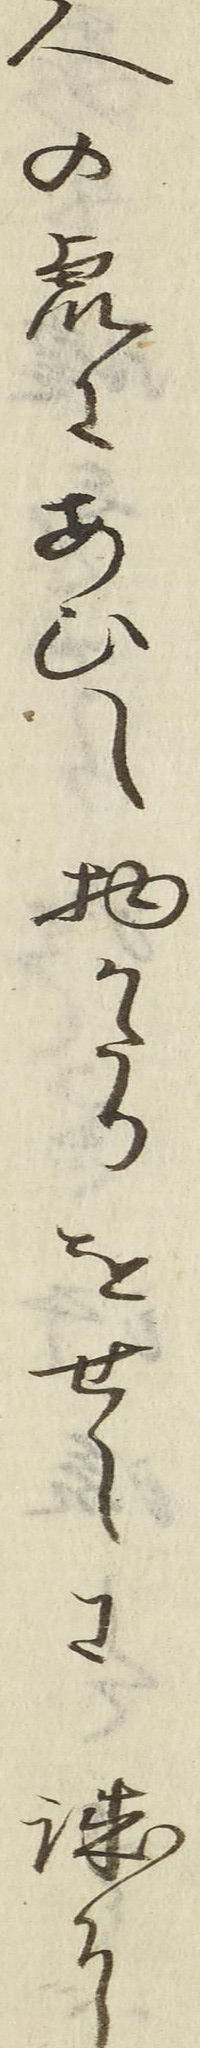人の虎にあひし物かたりをせしに誠に
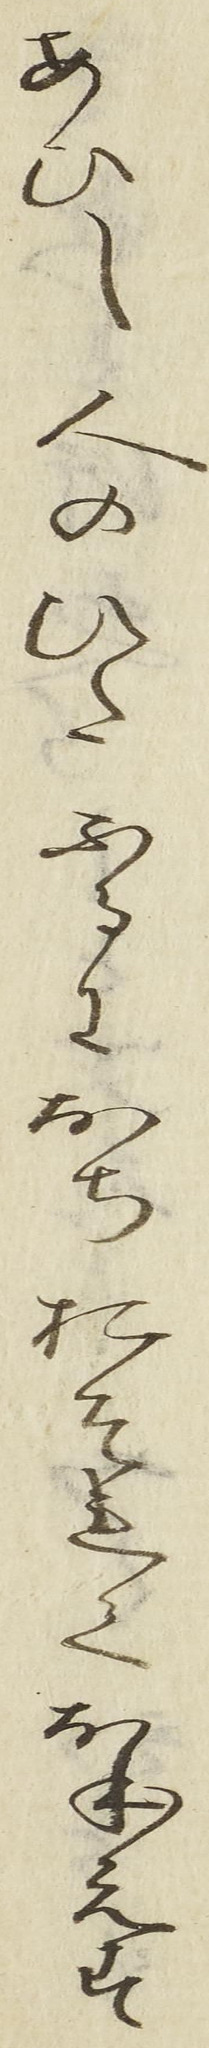あひし人のひたふるにおちおそれておほへす

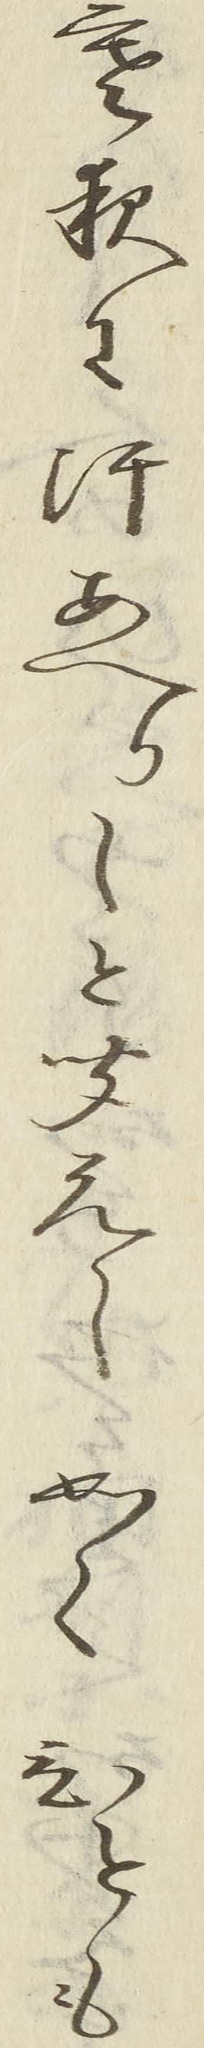寒夜に汗あへりしと聞えし如くひとも
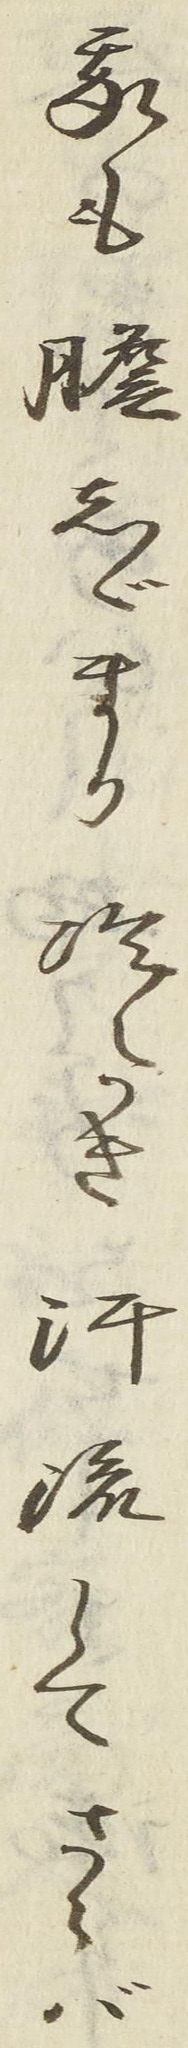我も膽しゞまり冷たき汗流してさらば
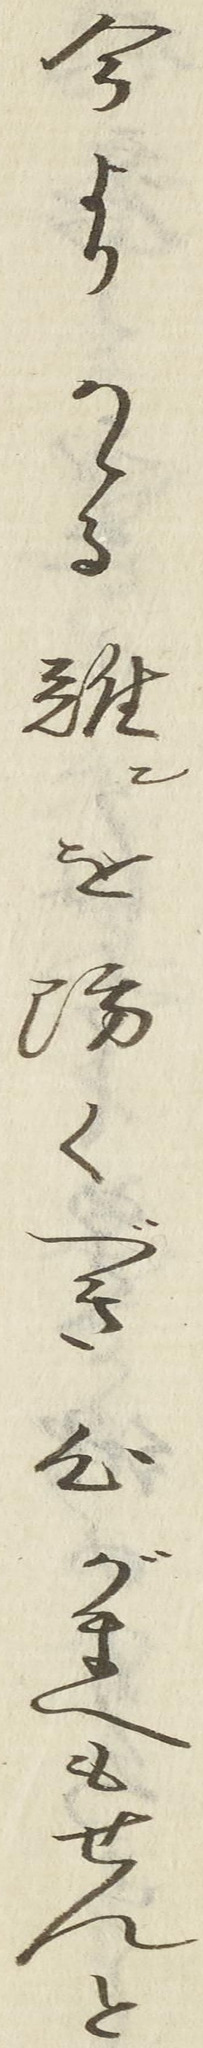今よりかゝる難防くべき心がまへもせんと
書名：やぶれ窓の記　全
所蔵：東京大学地震研究所図書室 Earthquake Research Institute Library, The University of Tokyo, JAPAN
